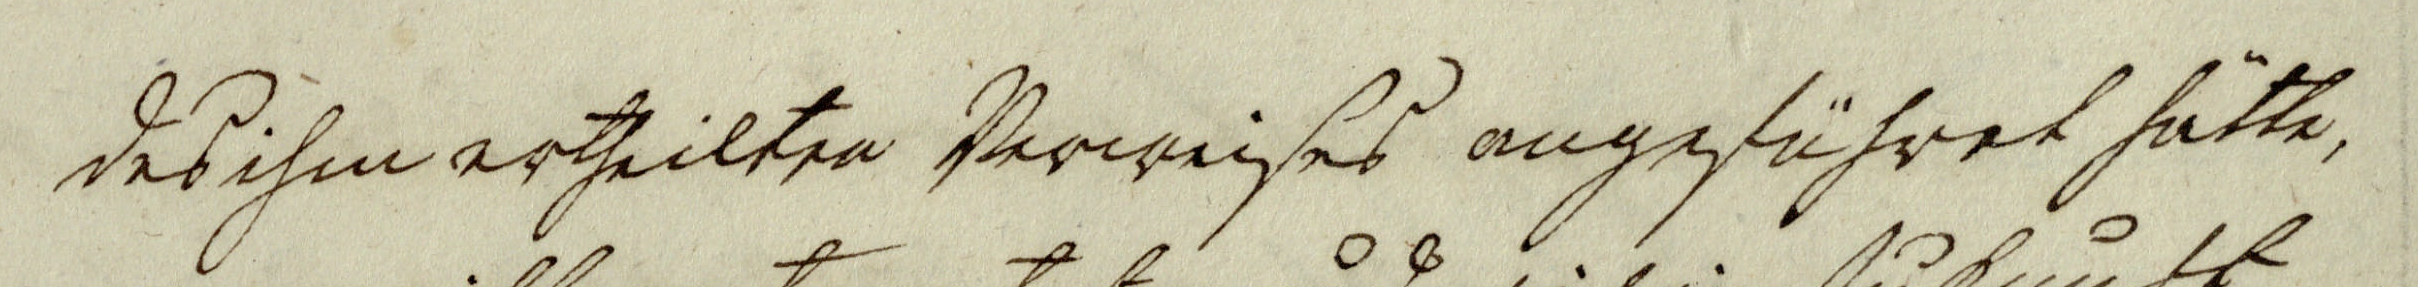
des ihm ertheilten Verweises angeführet hätte,
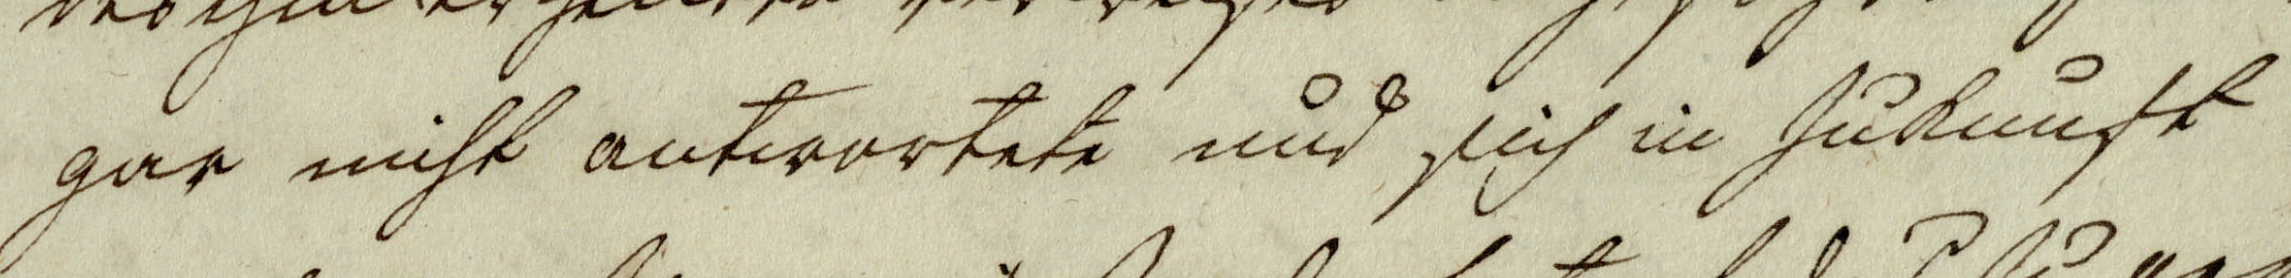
gar nicht antwortete und sich in Zukunft
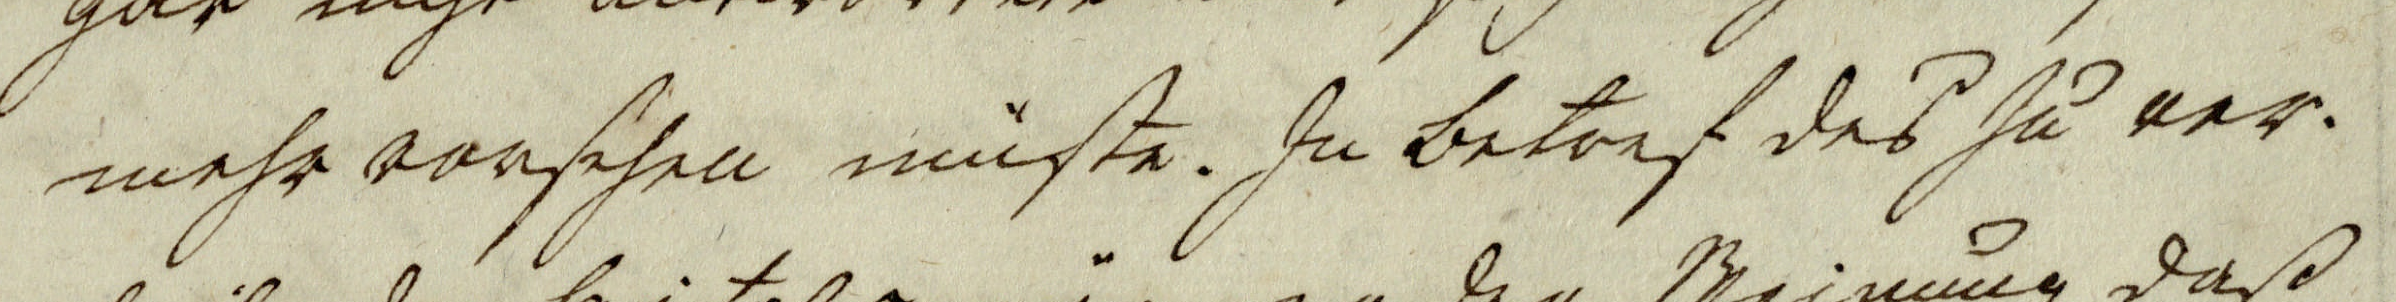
mehr vorsehen müßte. In Betref des zu ver¬
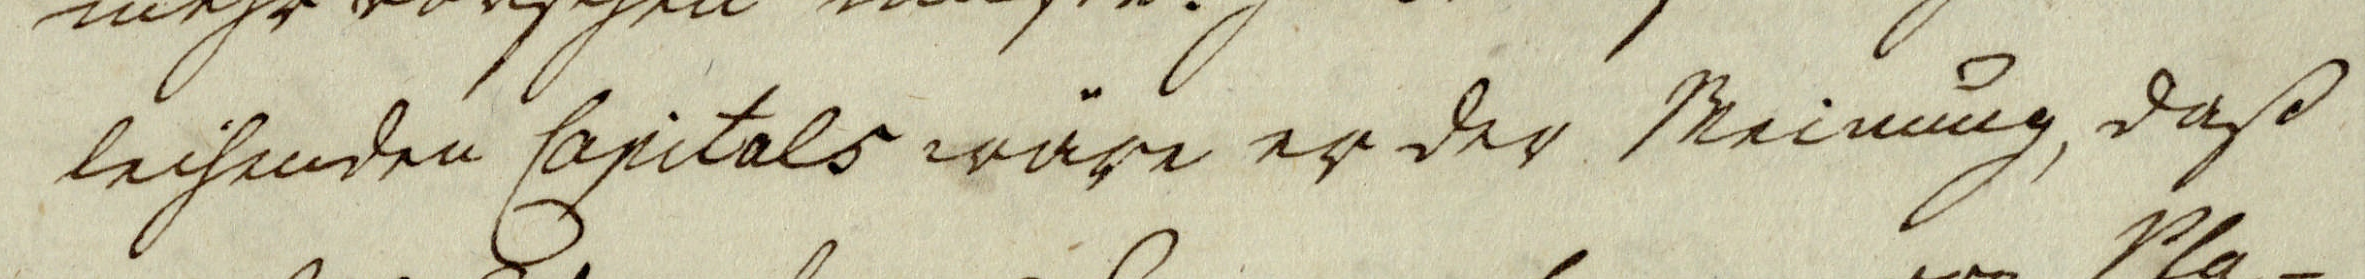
leihenden Capitals wäre er der Meinung, daß
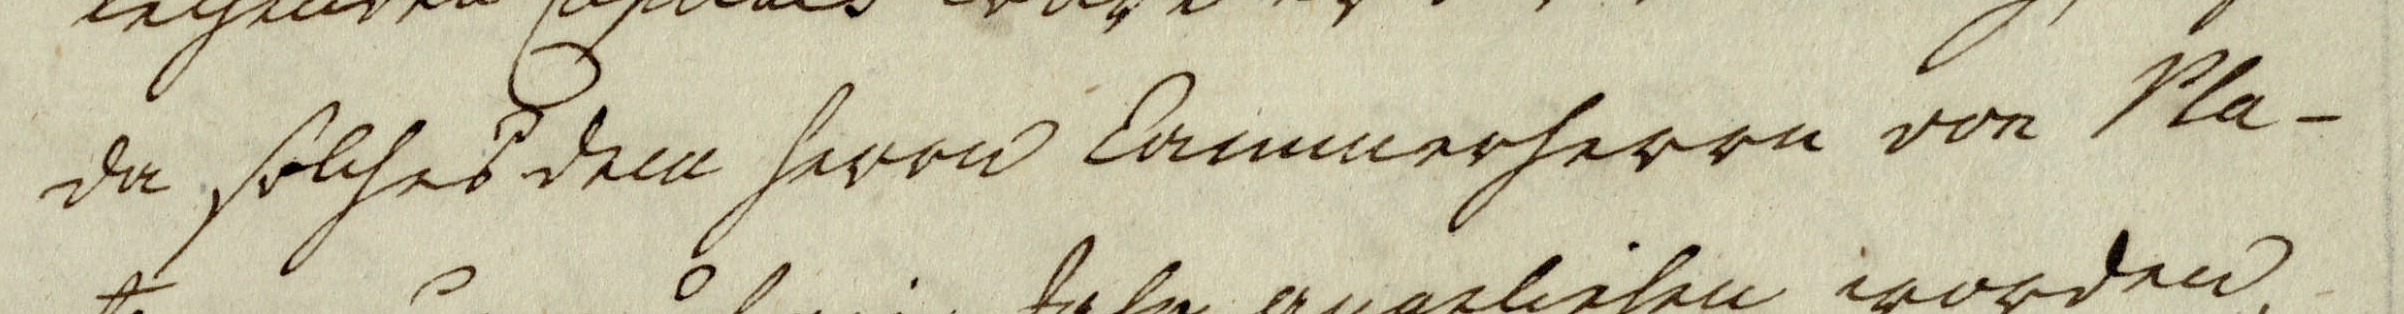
da solches dem Herrn Cammerherrn von Pla¬
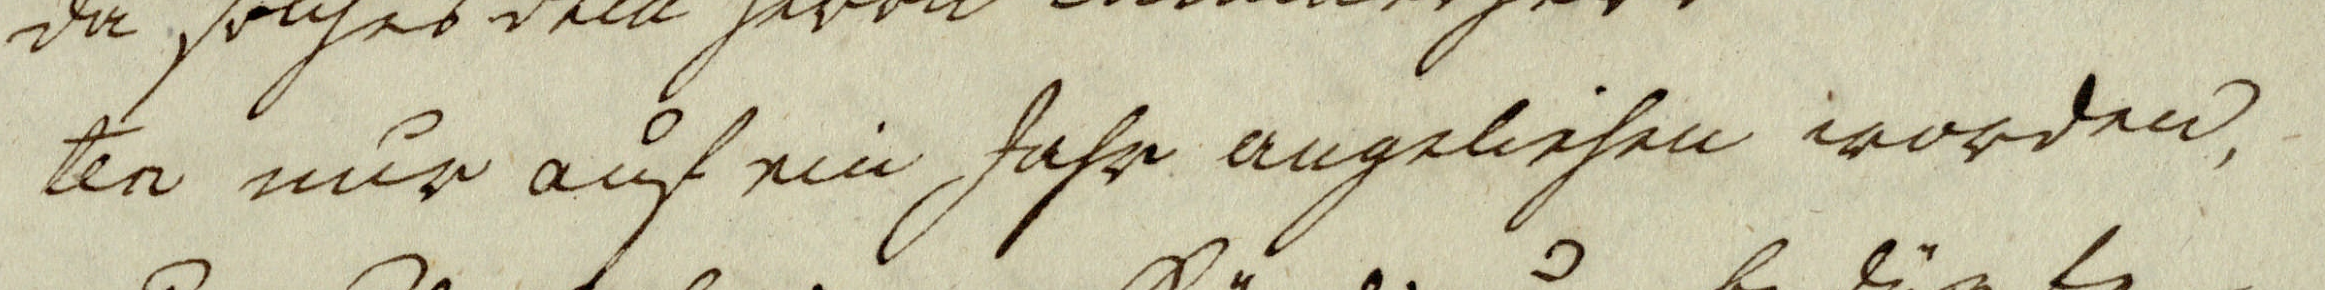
ten nur auf ein Jahr angeliehen worden,
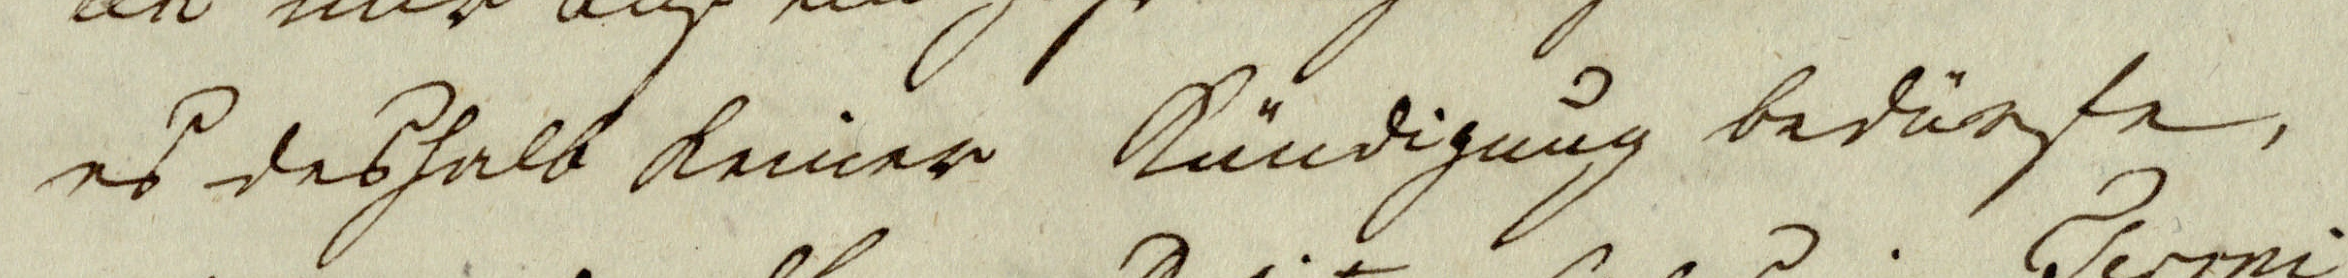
es deshalb keiner Kündigung bedürfe,
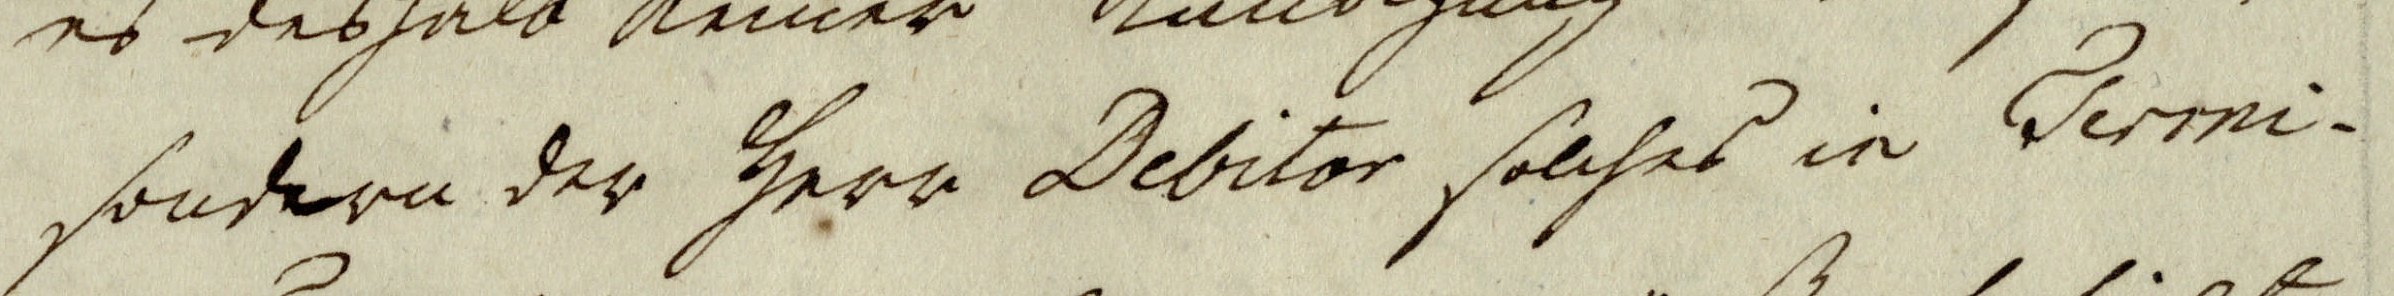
sondern der Herr Debitor solches in Termi¬
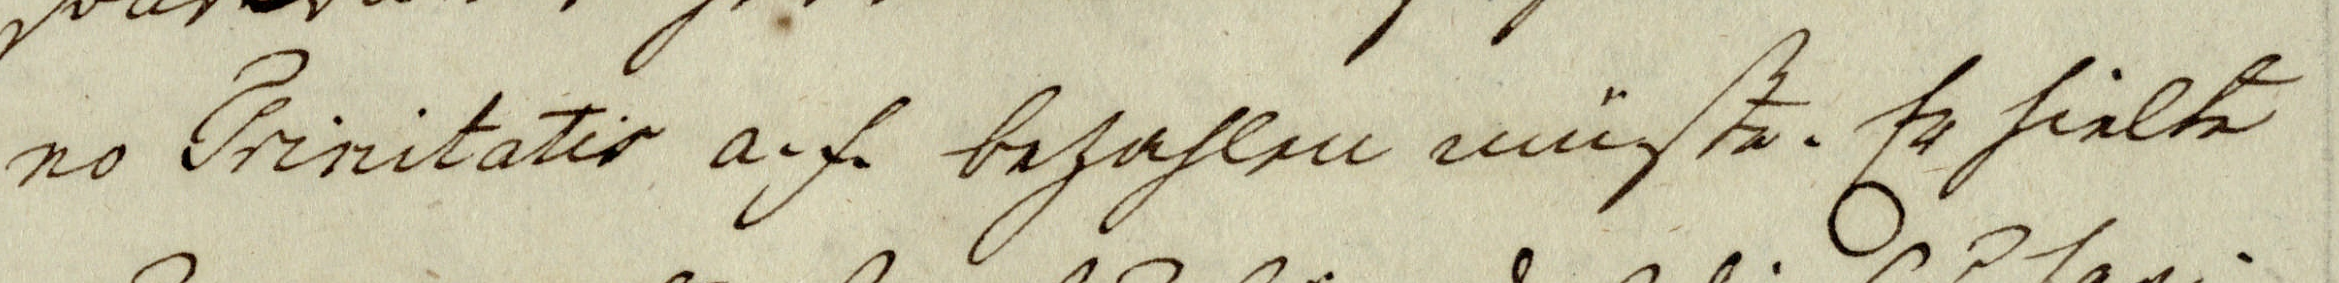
no Trinitatis a. f. bezahlen müßte. Er hielte
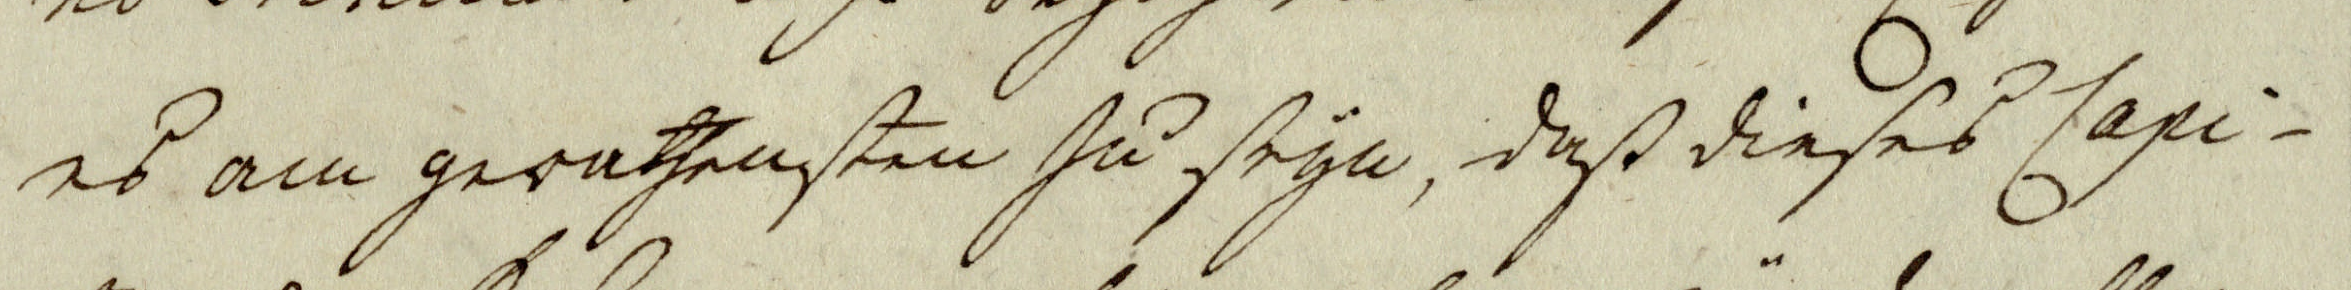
es am gerathensten zu seÿn, daß dieses Capi¬
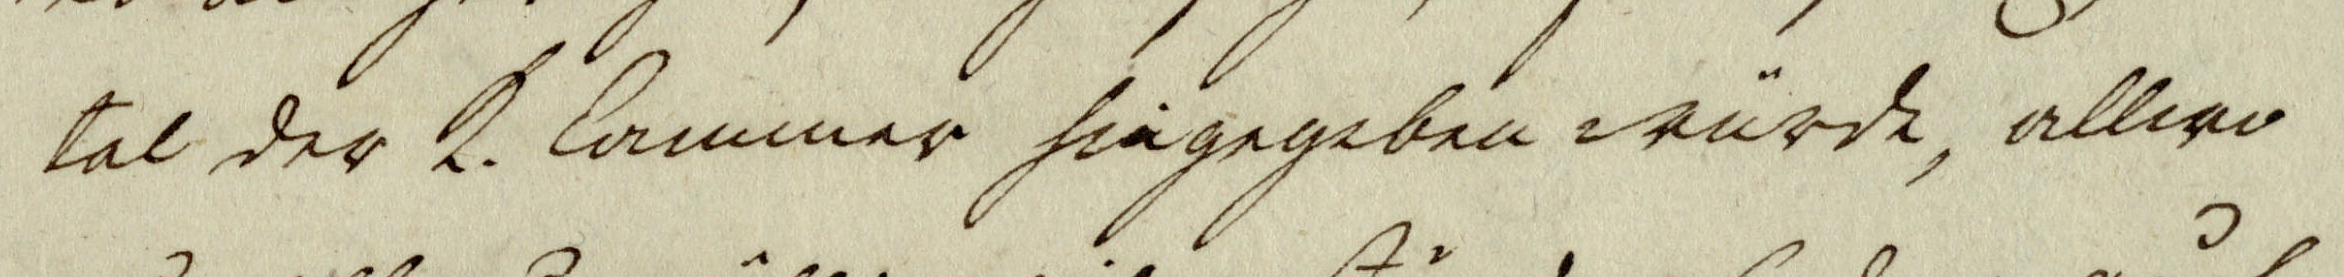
tal der K. Cammer hingegeben würde, allwo
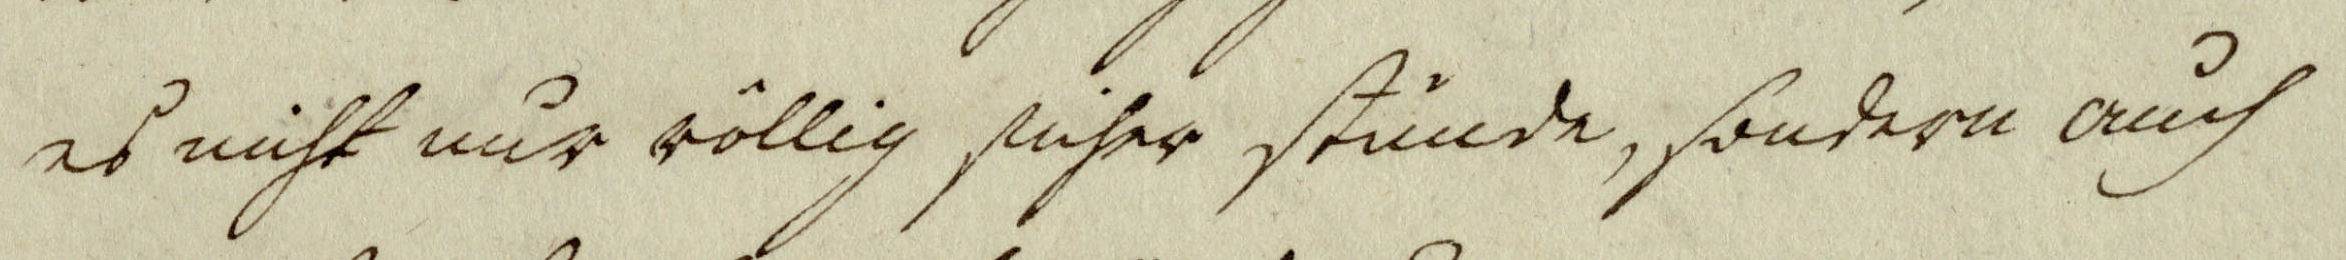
es nicht nur völlig sicher stünde, sondern auch
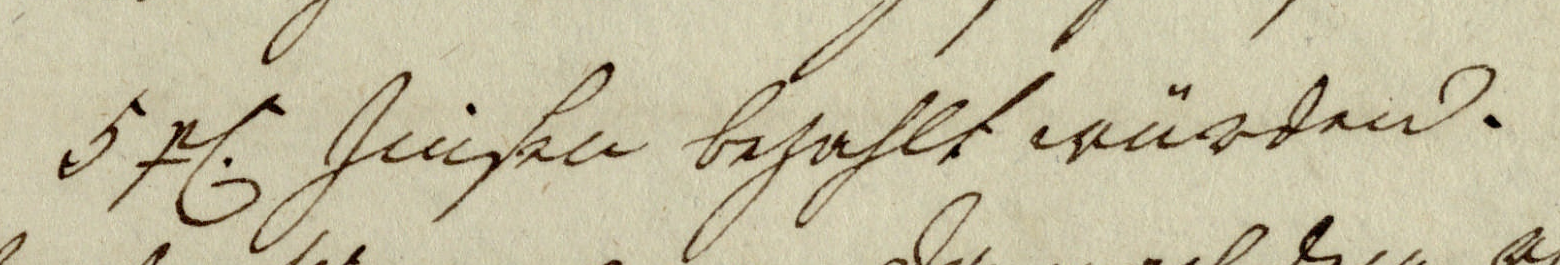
5 pl. Zinsen bezahlt würden.
